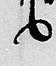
c.)
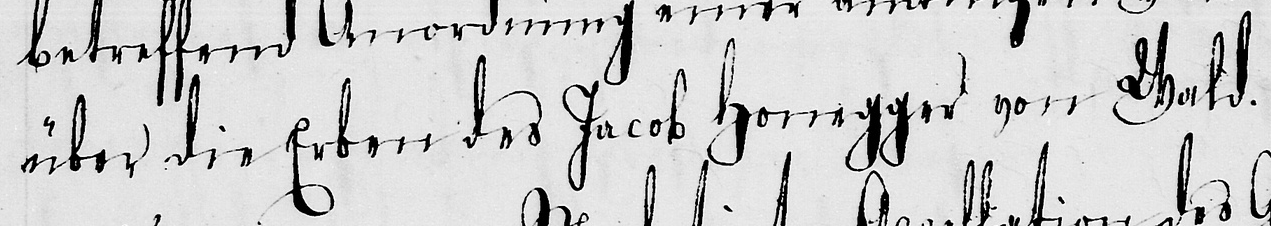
über die Erben des Jacob Honegger von Wald.
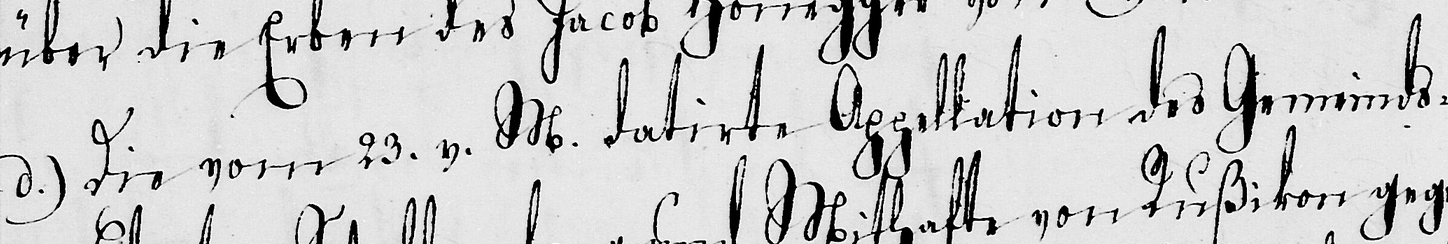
d.) Die vom 23. v. M. datirte Appellation des Gemeinds¬
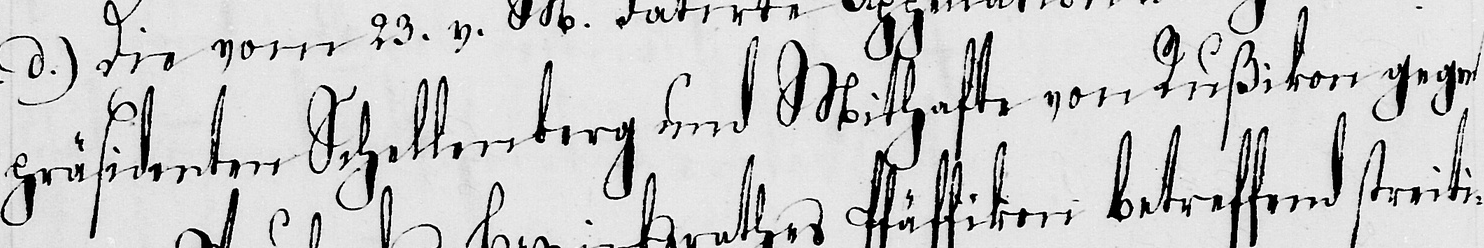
präsidenten Schellenberg und Mithafte von Rußikon gegen
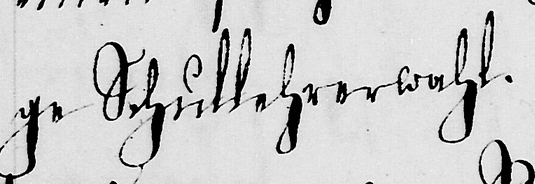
ge Schullehrerwahl.
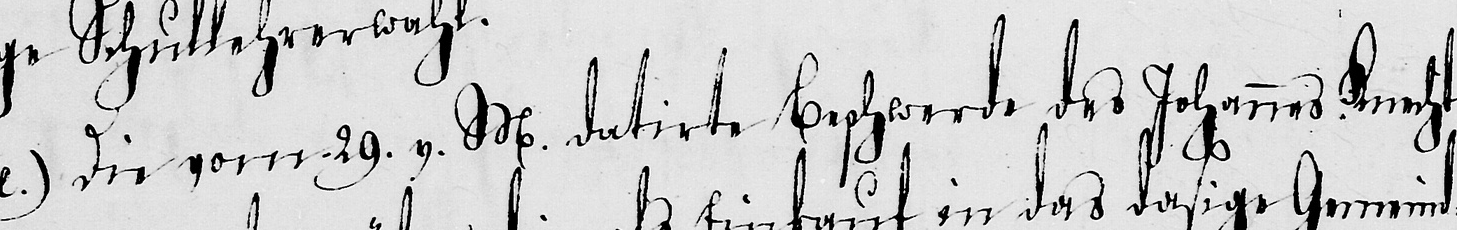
e.) Die vom 29. v. M. datirte Beschwerde des Johannes Knecht
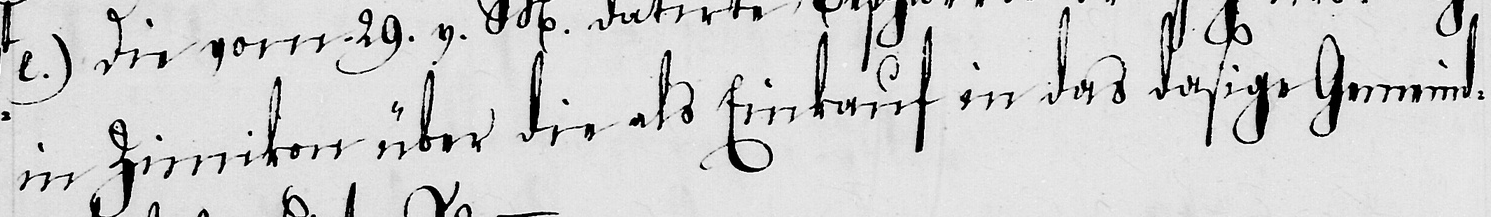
in Zimikon über die als Einkauf in das dasige Gemein¬
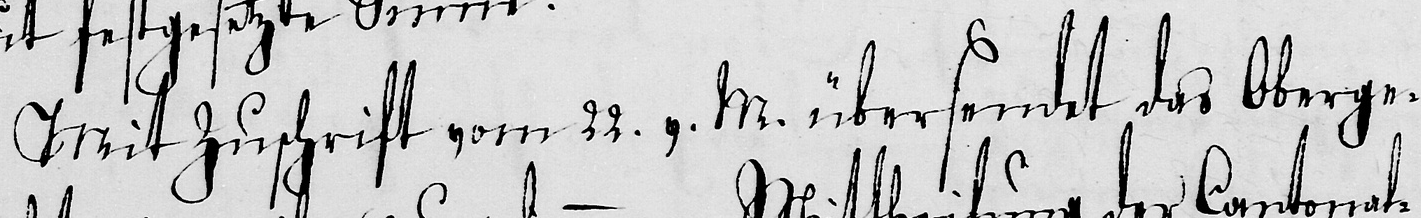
Mit Zuschrift vom 22. v. M. übersendet das Oberge¬
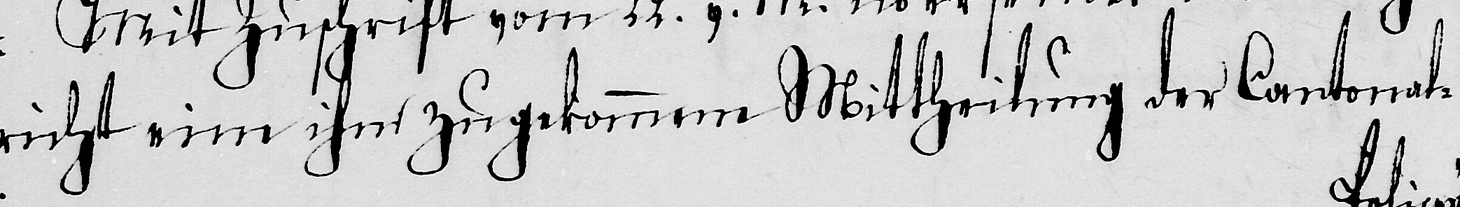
richt eine ihm zugekommene Mittheilung der Cantonal-
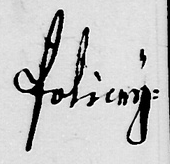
reiti¬
